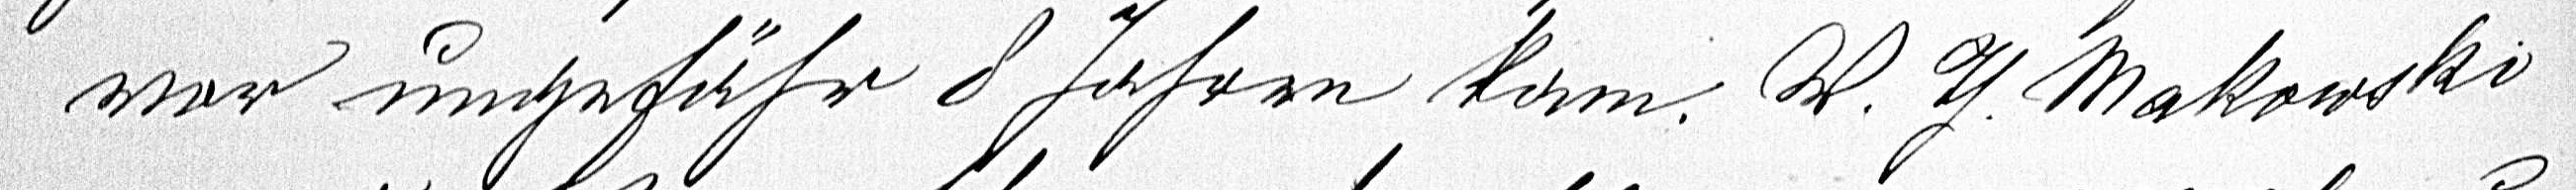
vor ungefähr 8 Jahren kam. W. Th. Makowski
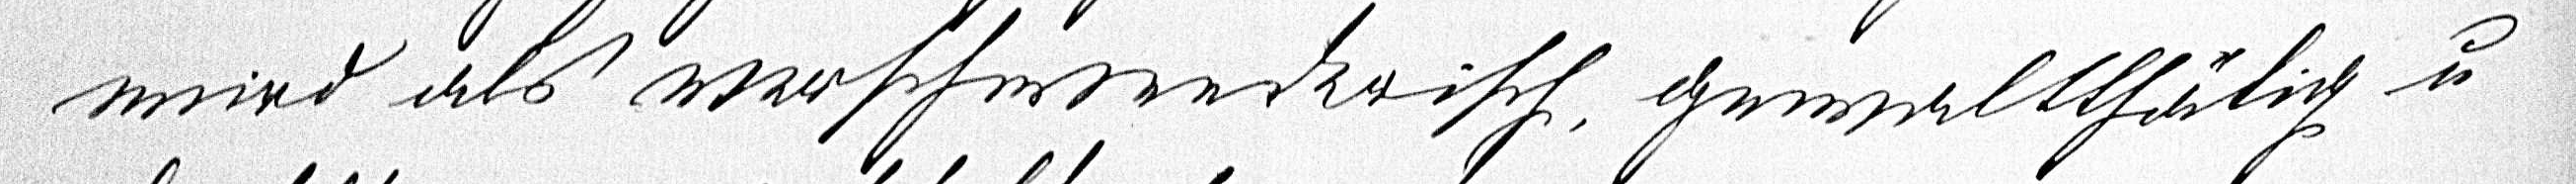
wird als verschwenderisch gewaltthätig u
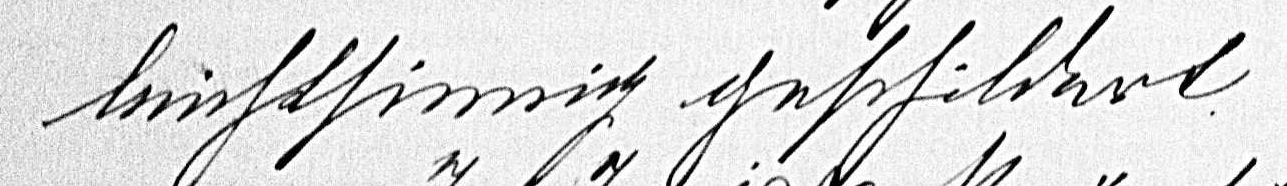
leichtsinnig geschildert.
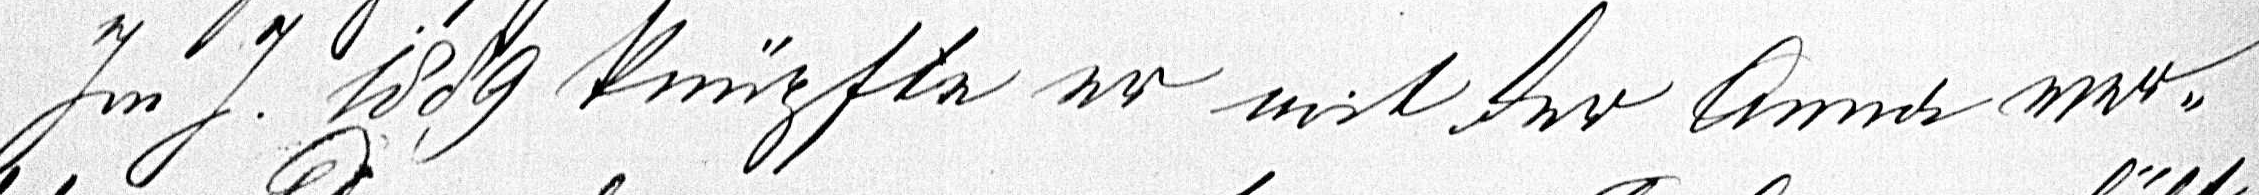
Im J. 1889 knüpfte er mit der Anna ver¬
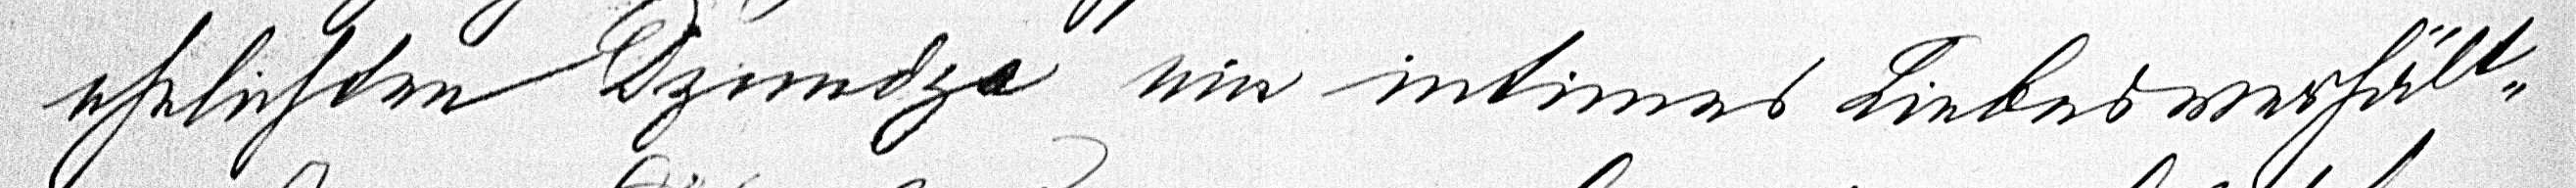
ehelichten Dzendza ein intimes Liebesverhält¬
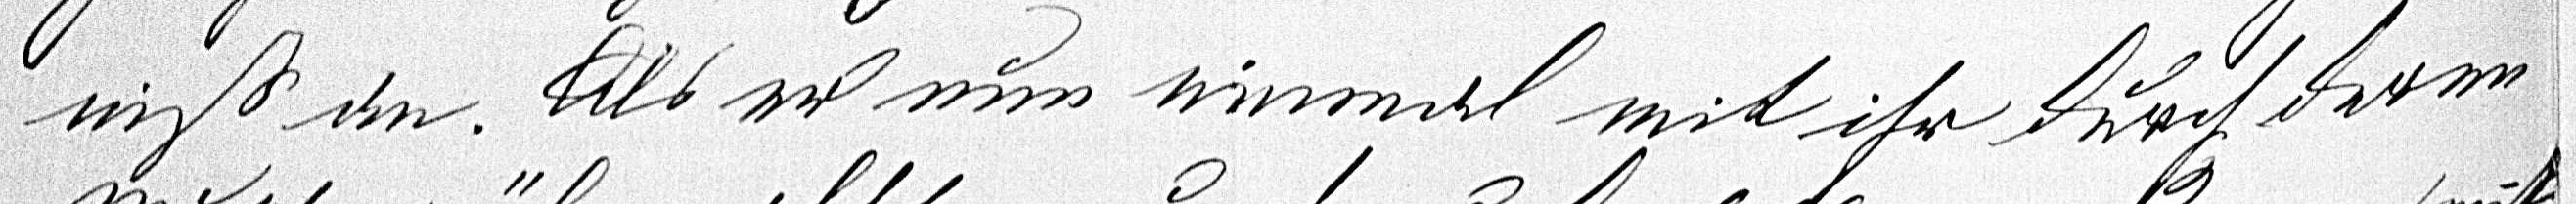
niß an. Als er nun einmal mit ihr durch deren
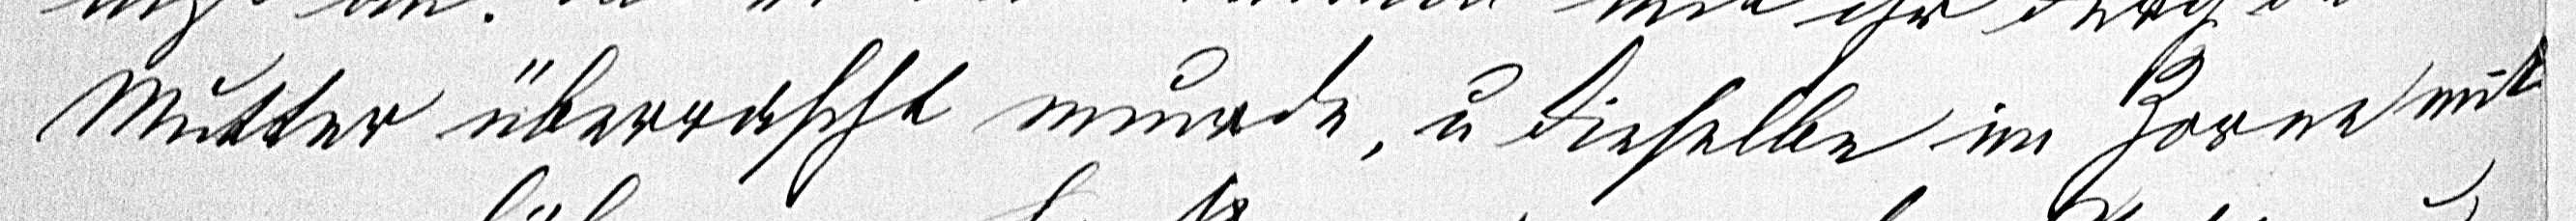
Mutter überrascht wurde, u. dieselbe im Zorn emit
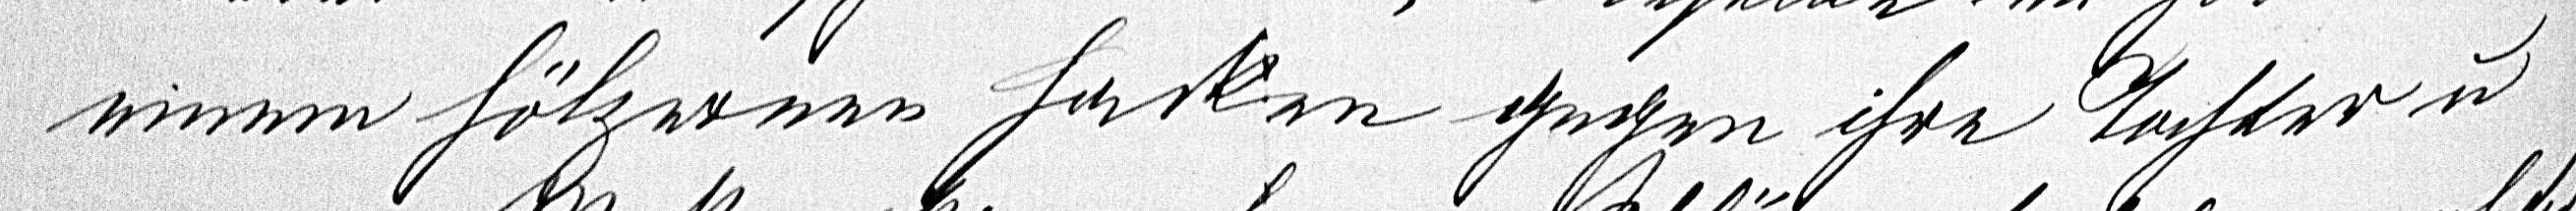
einem hölzernen Haken gegen ihre Tochter u.
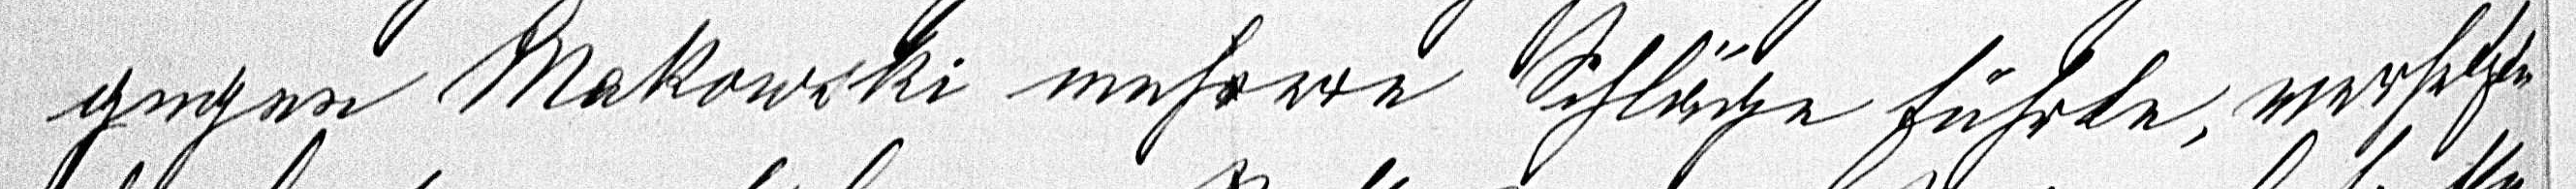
gegen Makowski mehrere Schläge führte, versetzte
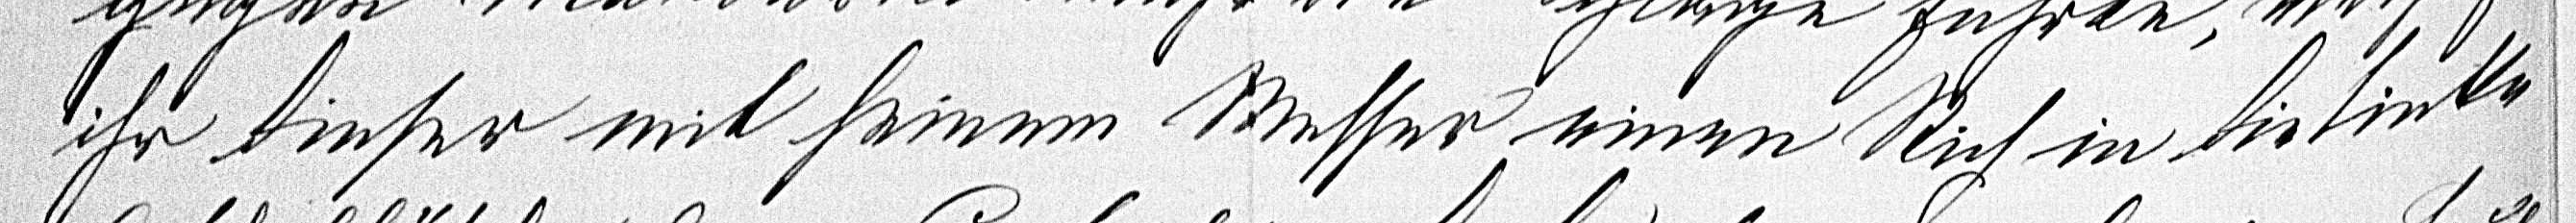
ihr dieser imt seinem Messer einen Stich in die linke
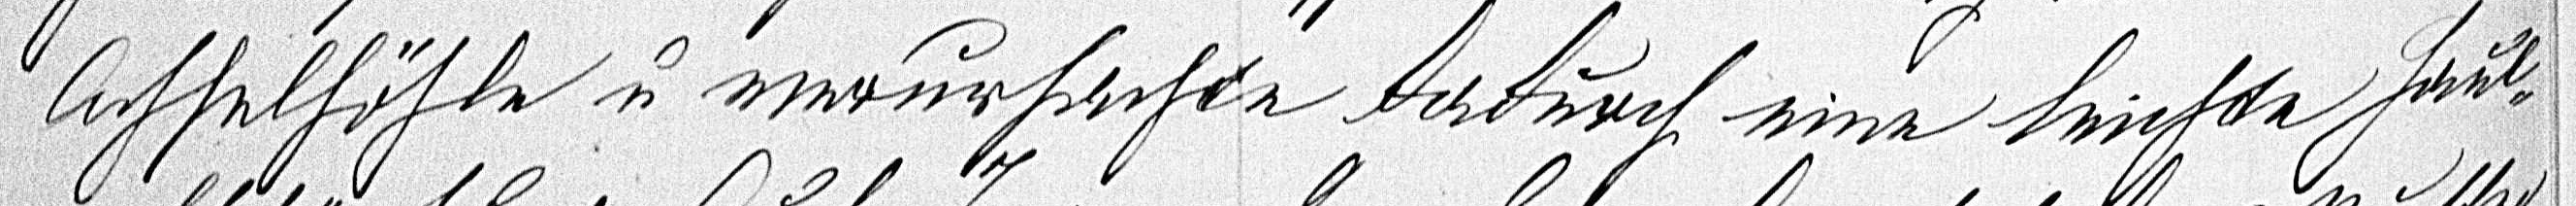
Achselhöhle u verursachte dadurch eine leichte Haut¬
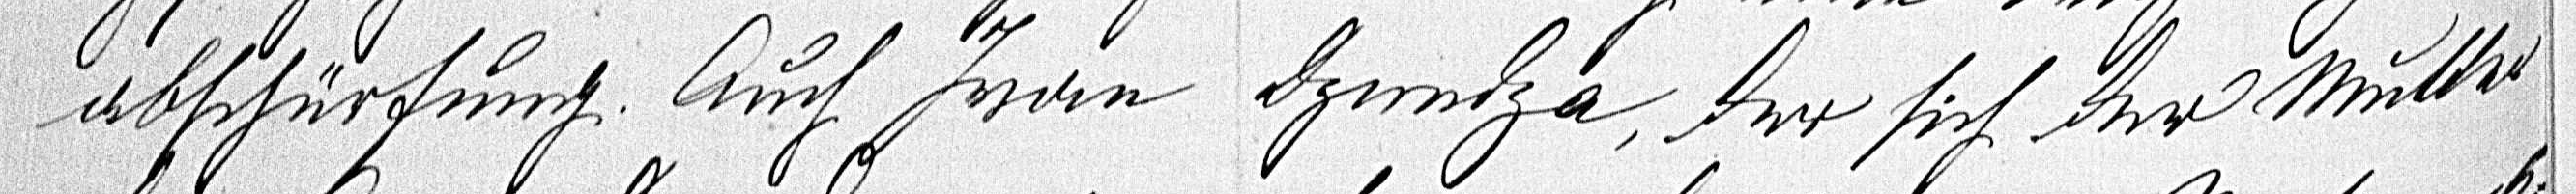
abschürfung. Auch Iwan Dzendza, der sich der Mutter
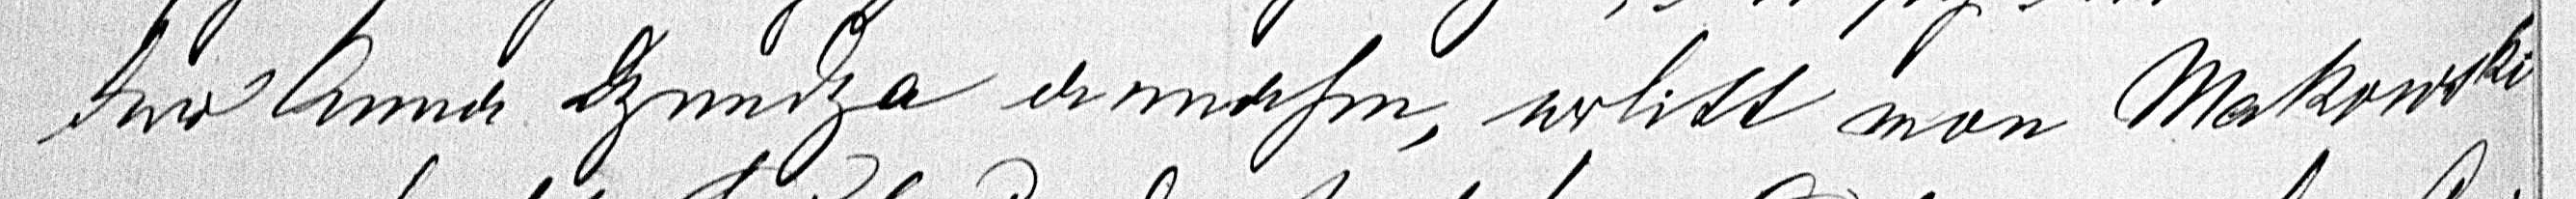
der Anna Dzendza annahm, erlitt von Makowski
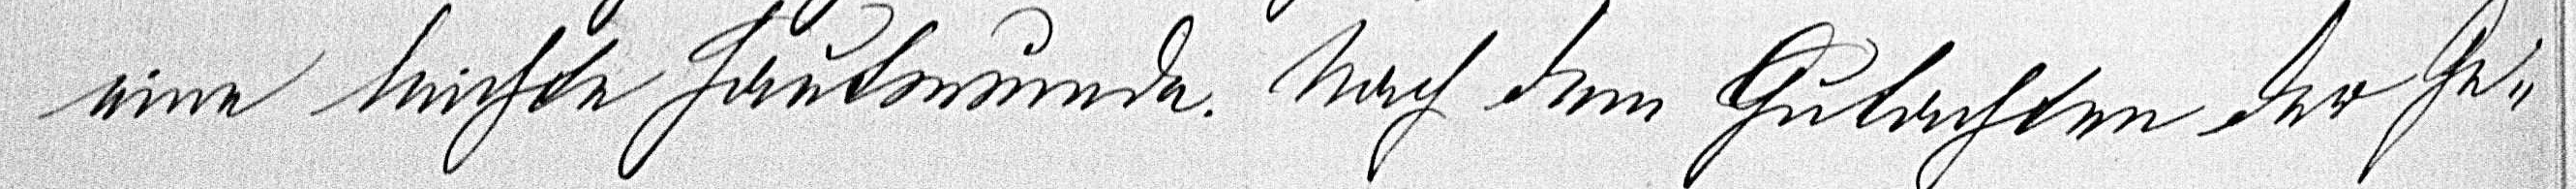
eine leichte Hautwunde. Nach de Gutachten der Ge¬
